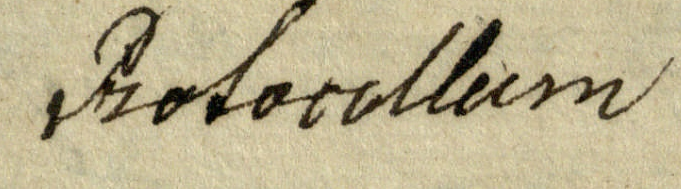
Protocollum
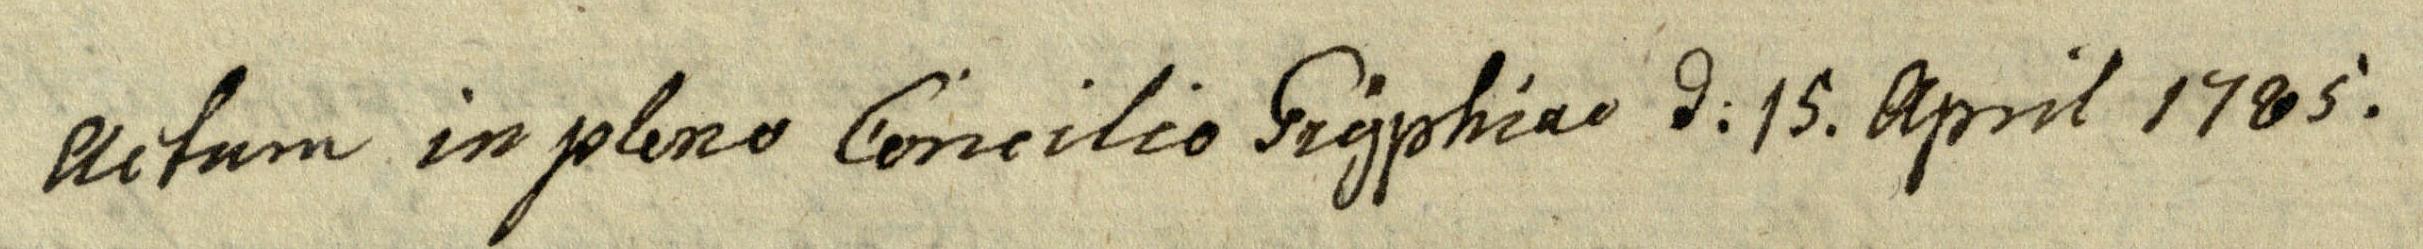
Actum in pleno Concilio Grÿphiae d. 15. April 1785.
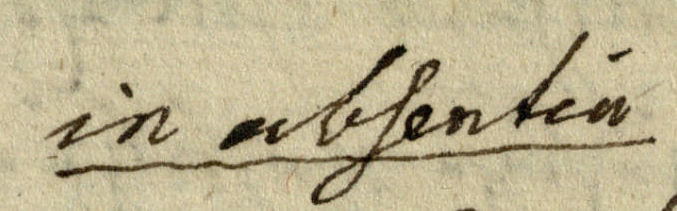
in absentia
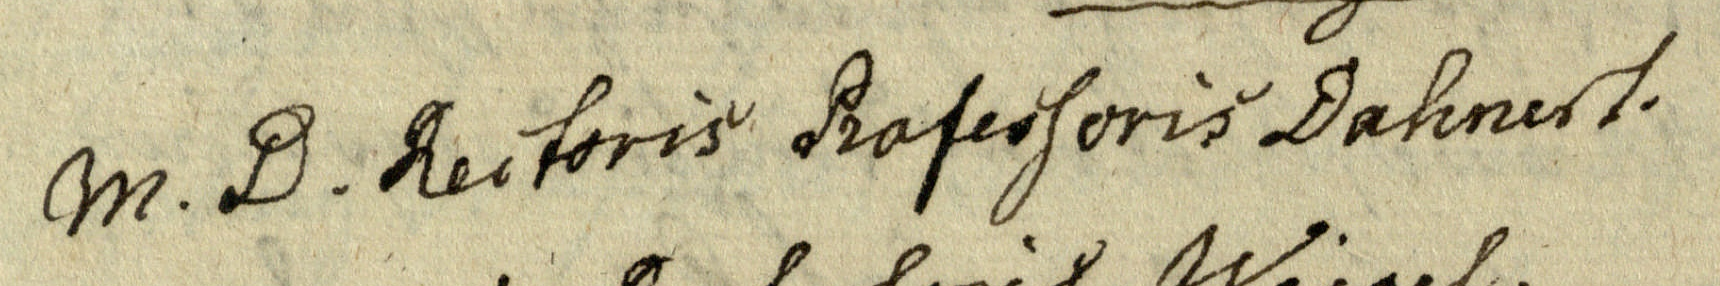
M. D. Rectoris Professoris Dähnert
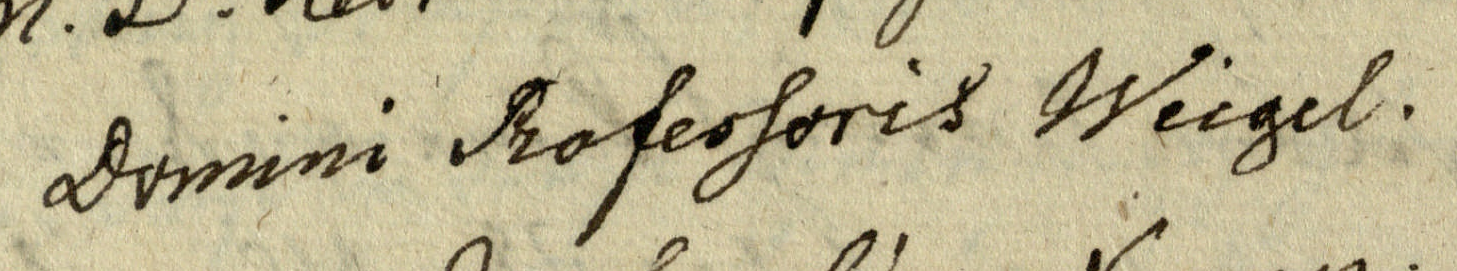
Domini Professoris Weigel.
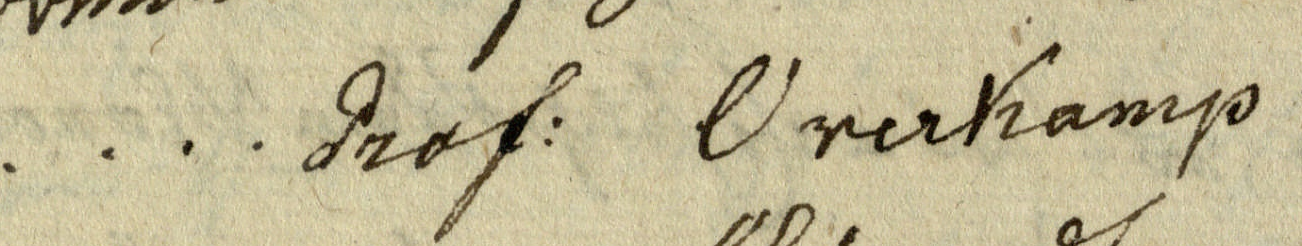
Prof. Overkamp.
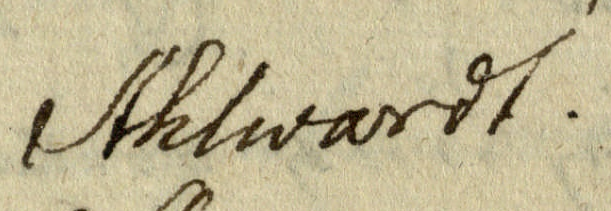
Ahlwardt.
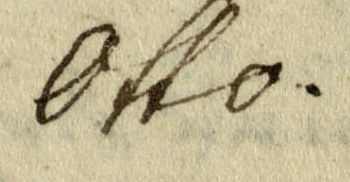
Otto.
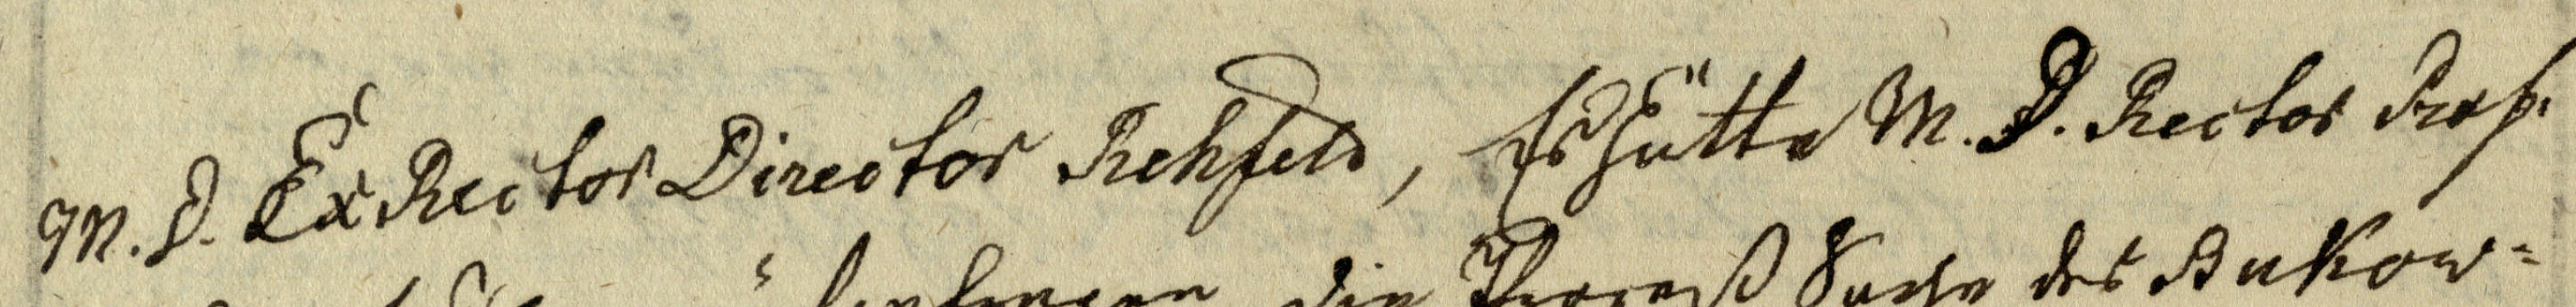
M. D. Ex Rector Director Rehfeld, Es hätte M. D. Rector Prof.
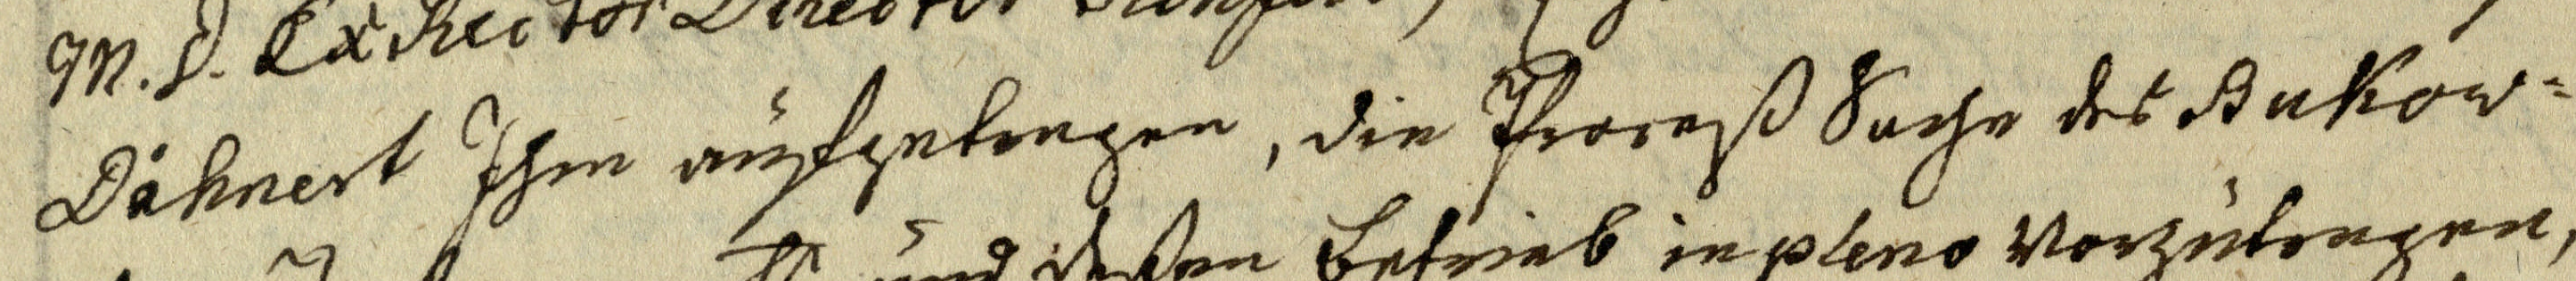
Dähnert Ihm aufgetragen, die Proceß Sache des Bukow¬
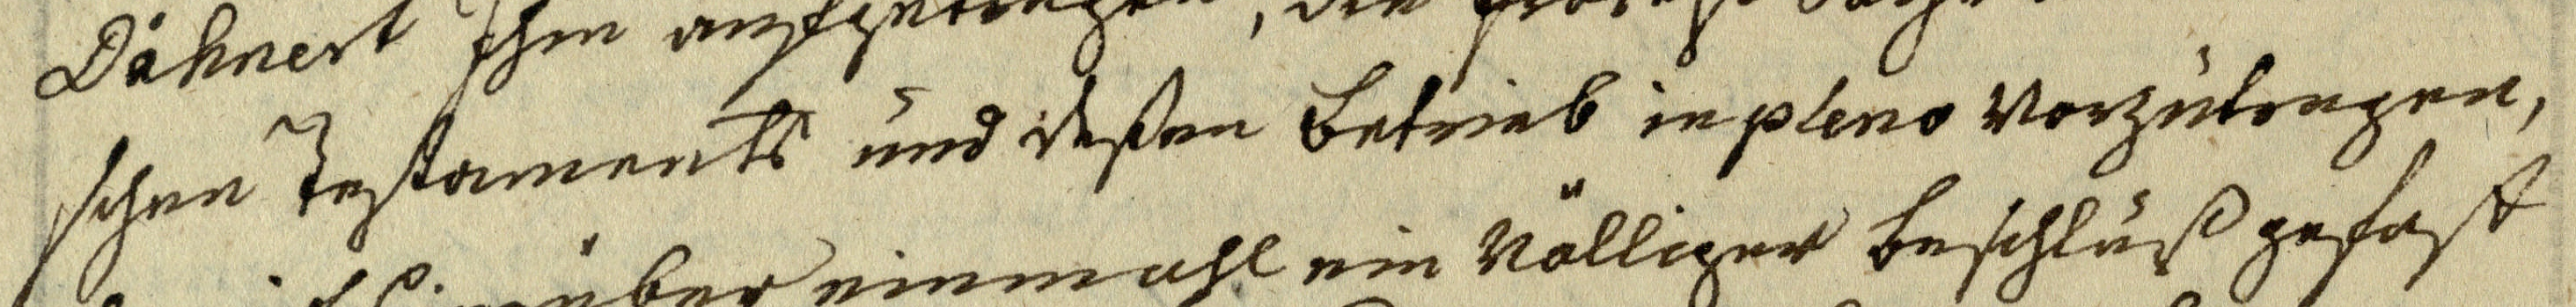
schen Testaments und deßen Betrieb in pleno vorzutragen,
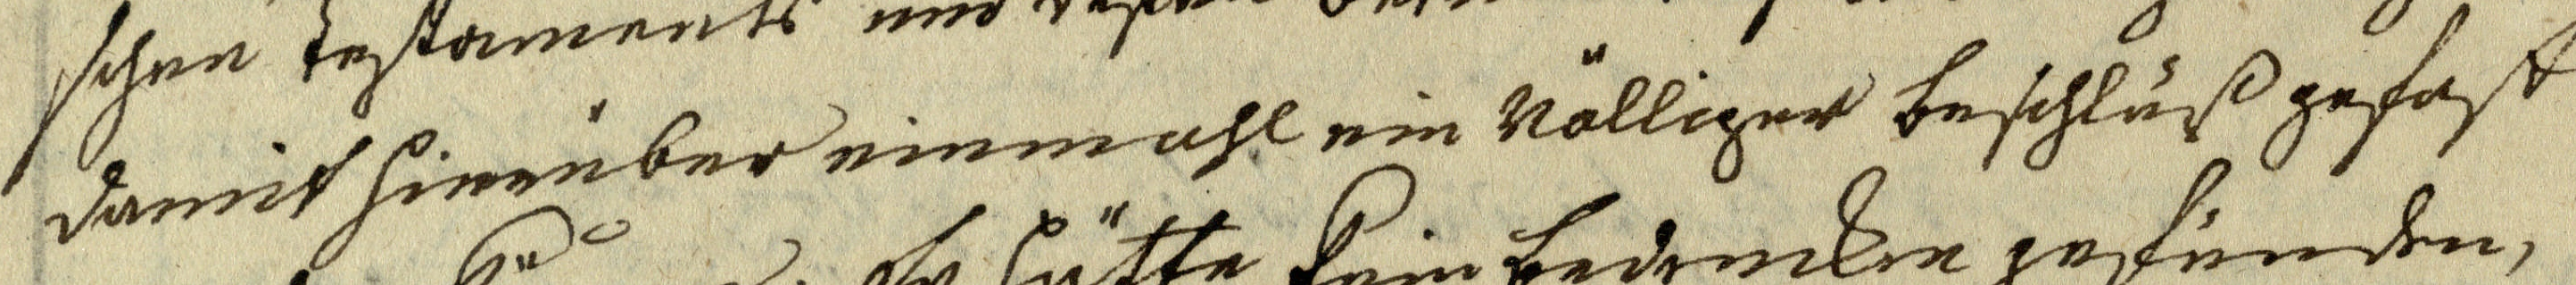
damit hierüber einmahl ein völliger Beschluß gefast
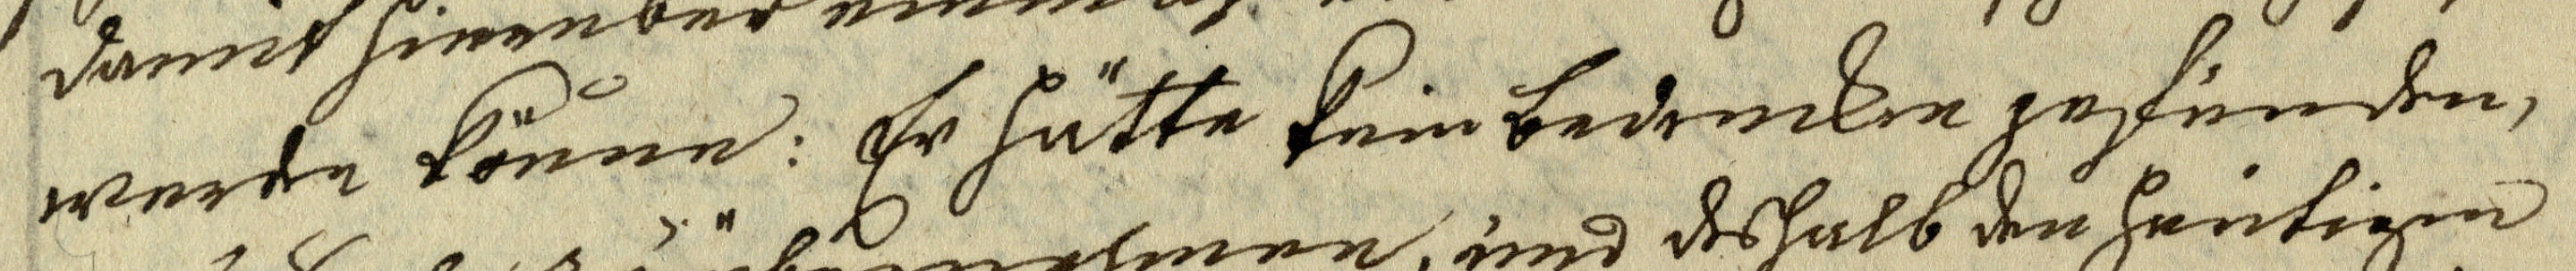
werden könne: Er hätte kein Bedencken gefunden,
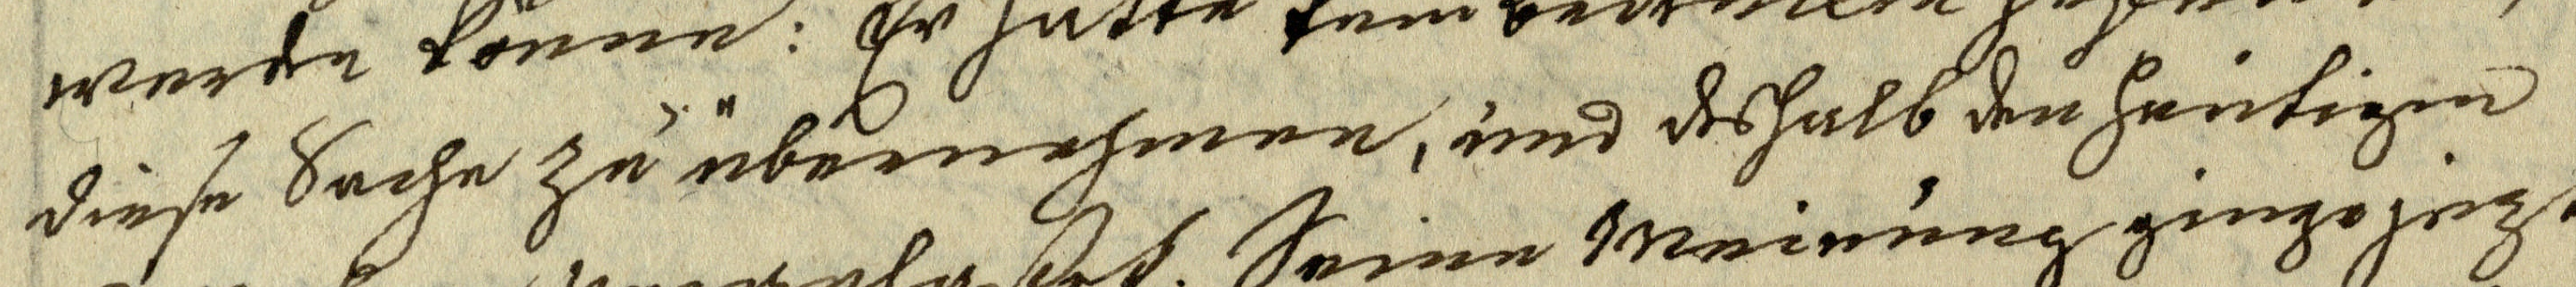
diese Sache zu übernehmen, und deshalb den heutigen
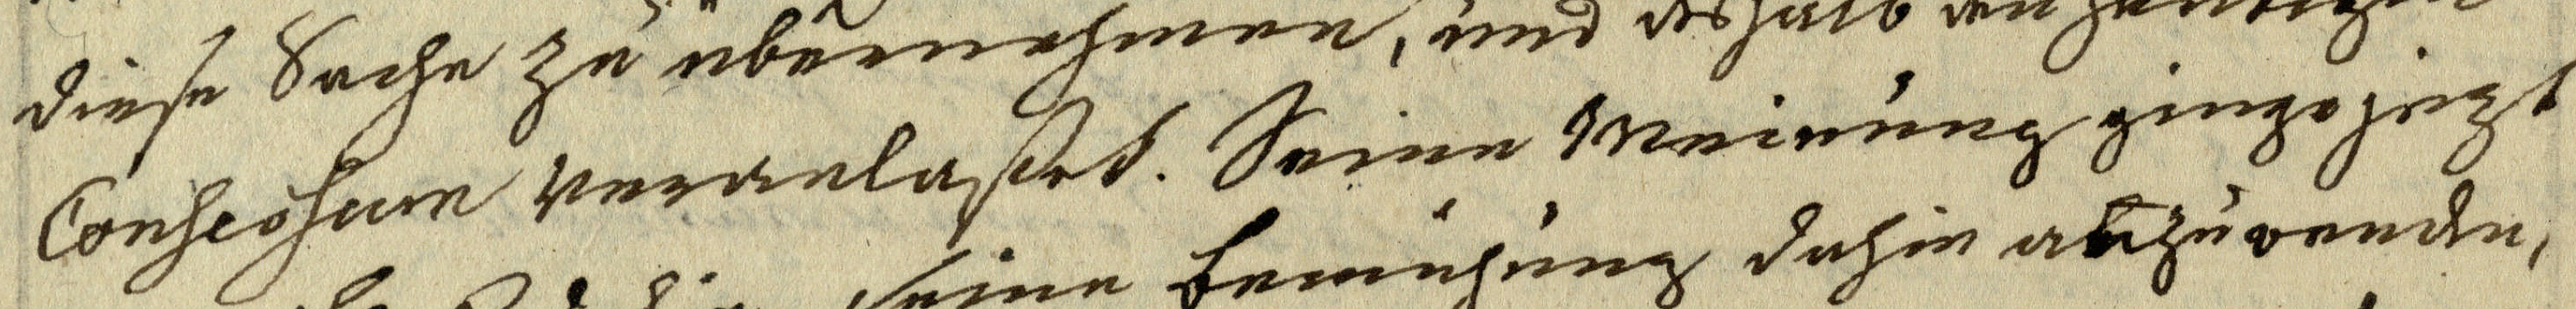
Consessum veranlaßet. Seine Meinung ginge jezt
